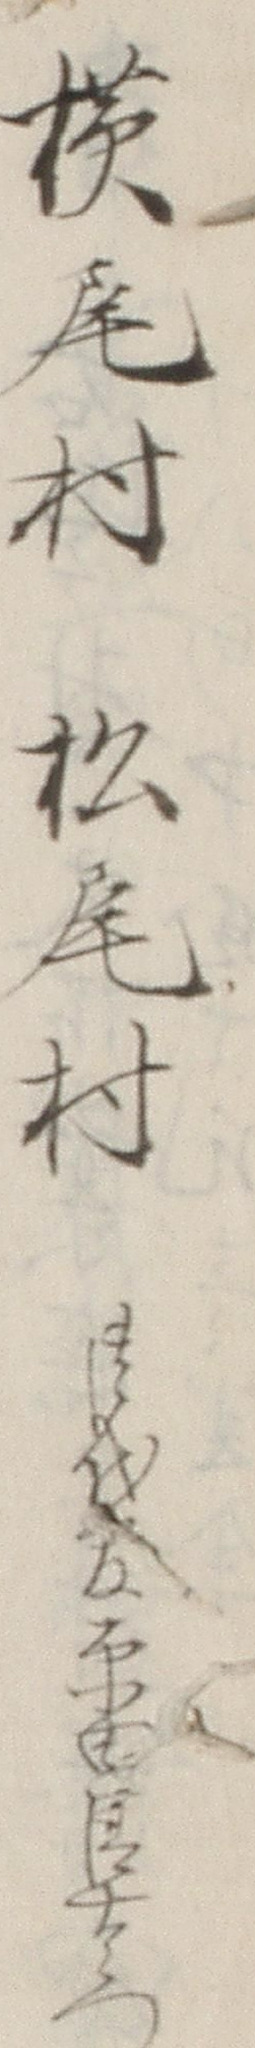横尾村松尾村御代官原田清右衛門
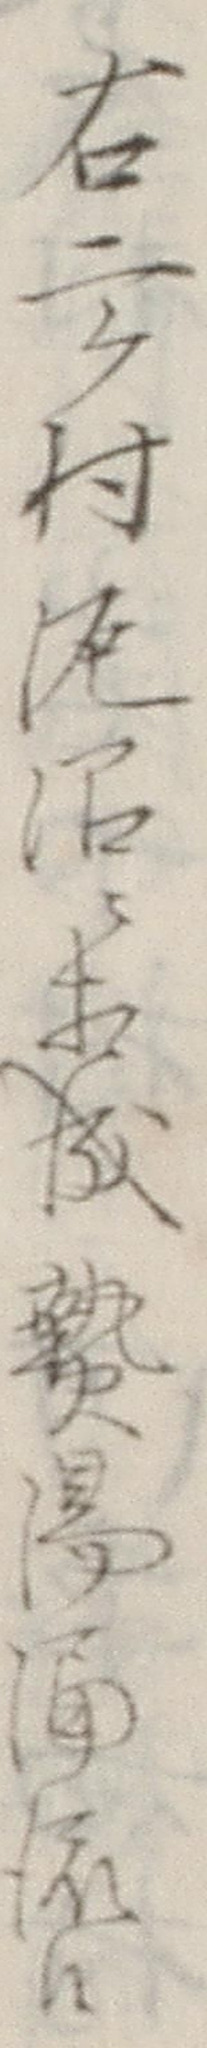右二ケ村泥沼ニ相成熱湯湧流候
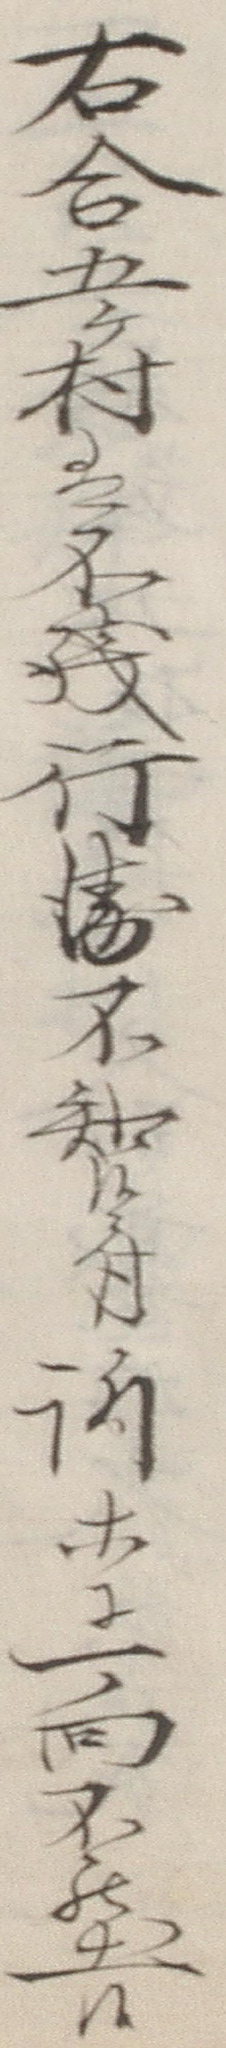右合五ケ村は不残行衛不知候ニ付訴等に一向不罷出候
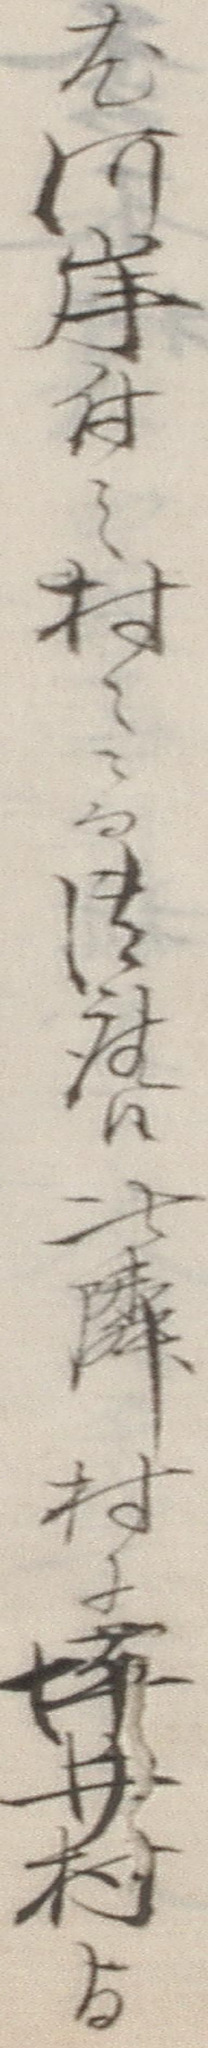尤河岸付之村々ニ而御座候此隣村に坪井村と
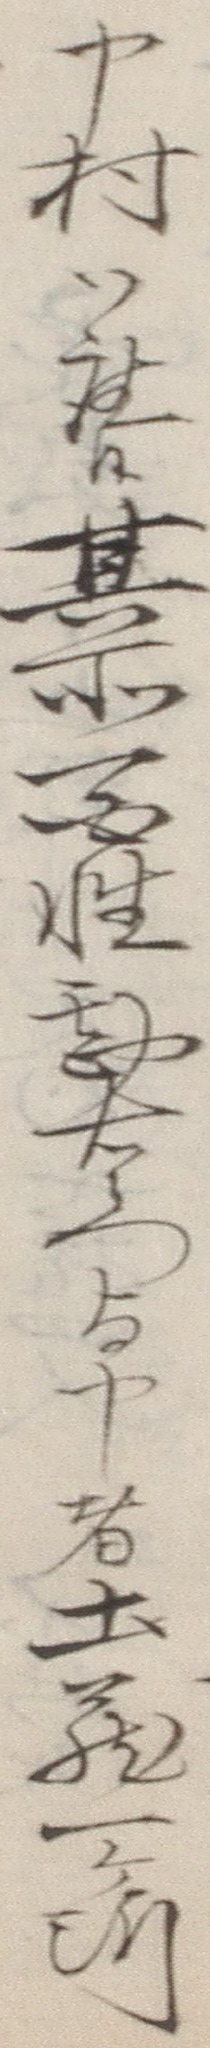申村御座候其所百姓勘右衛門と申者土蔵一ケ所
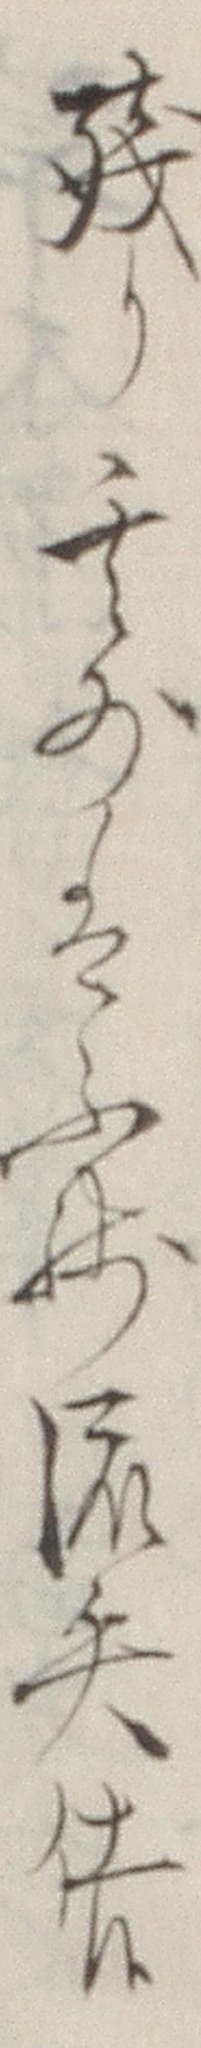残り其外は不残流失仕候
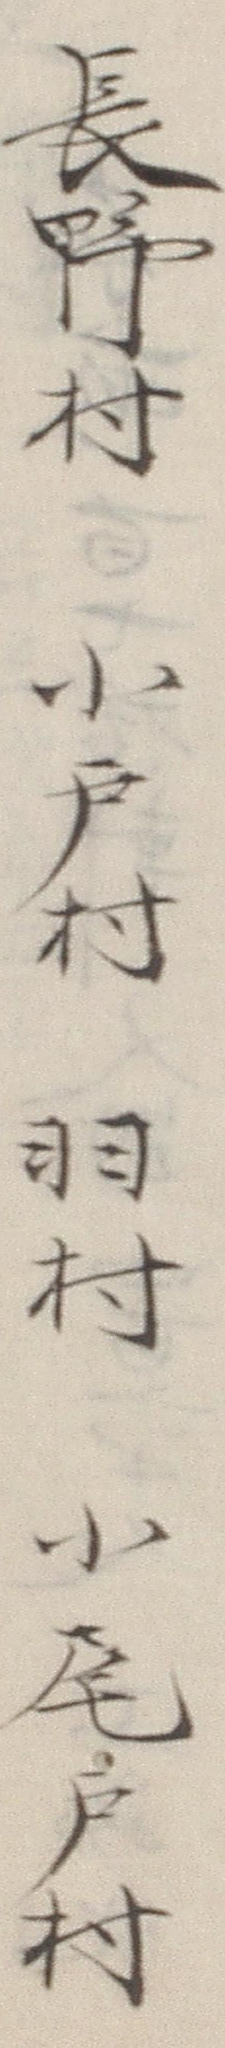長野村小戸村羽村小尾戸村
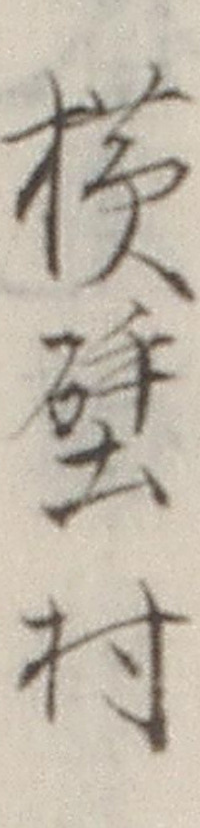横壁村
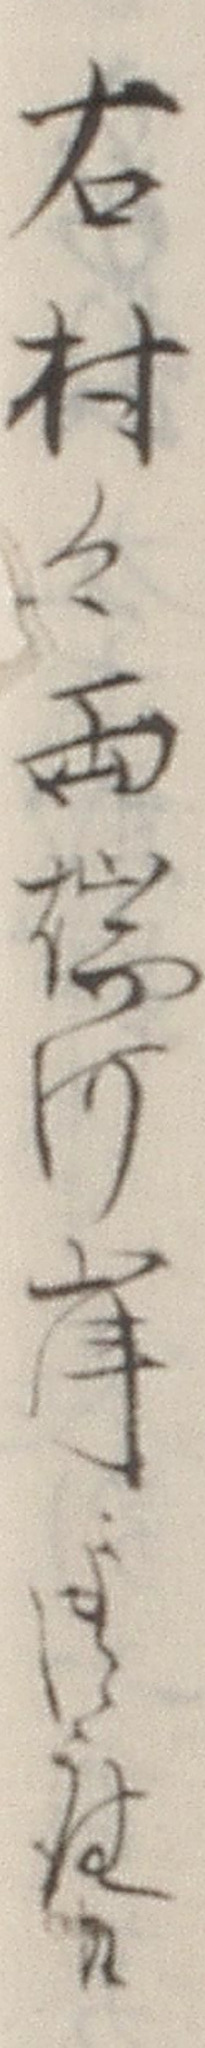右村々両端河岸ニ御座候
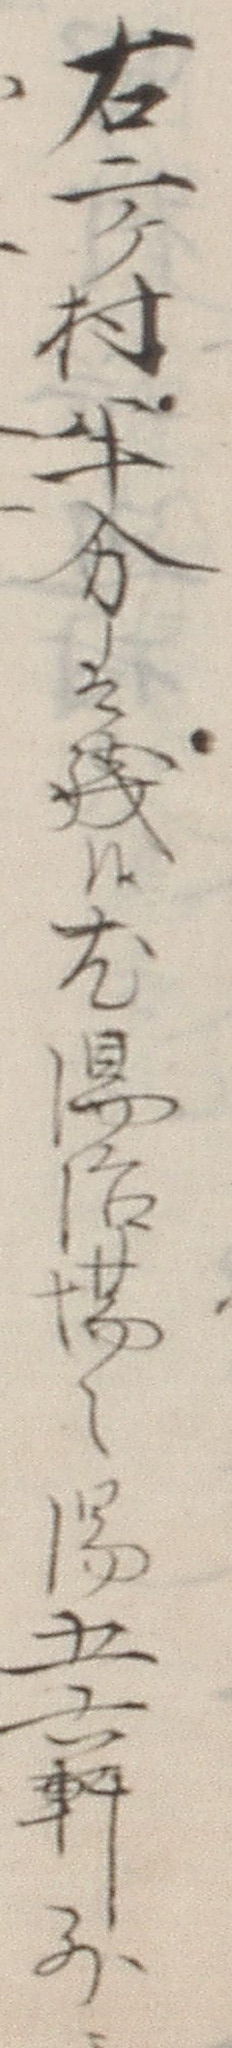右二ケ村半分は残候尤湯治場之湯五六軒なシ
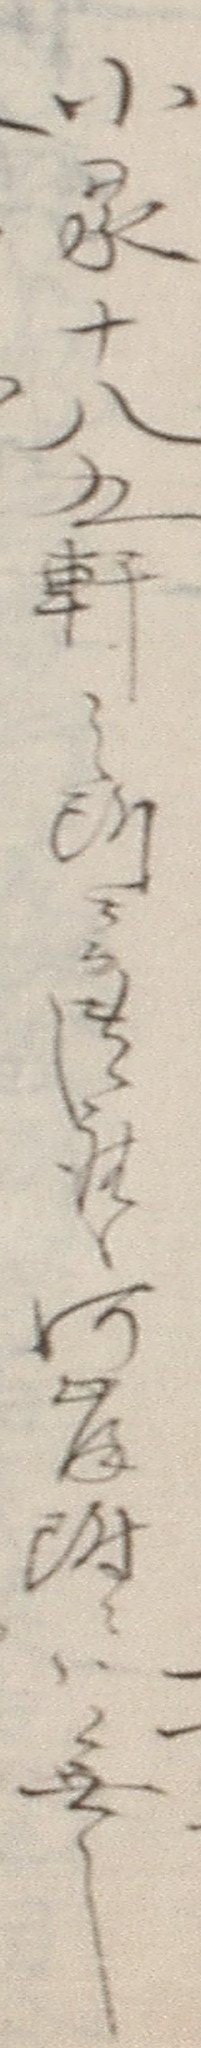小家十八九軒之所ニ而御座候河岸附ニハ無之
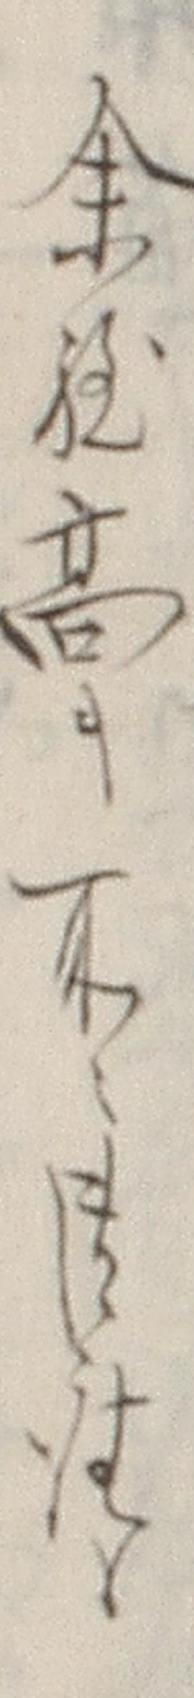余程高キ所ニ御座候
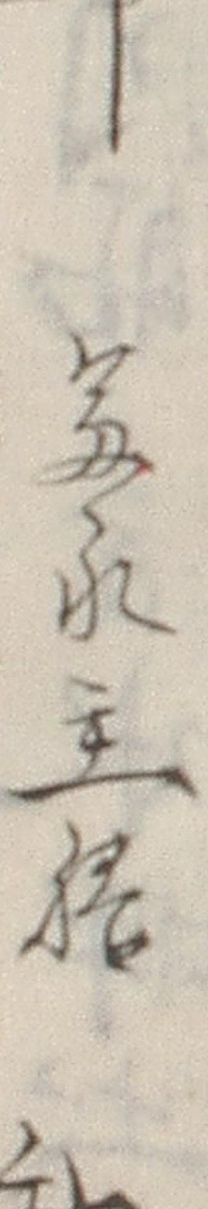富山主膳
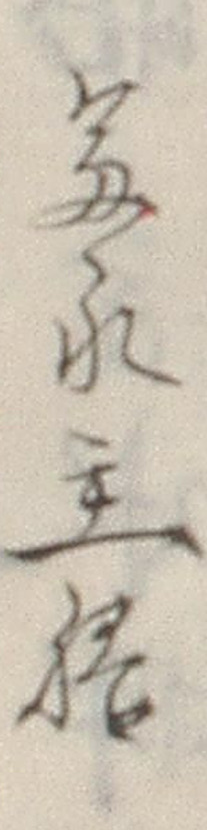富山主膳
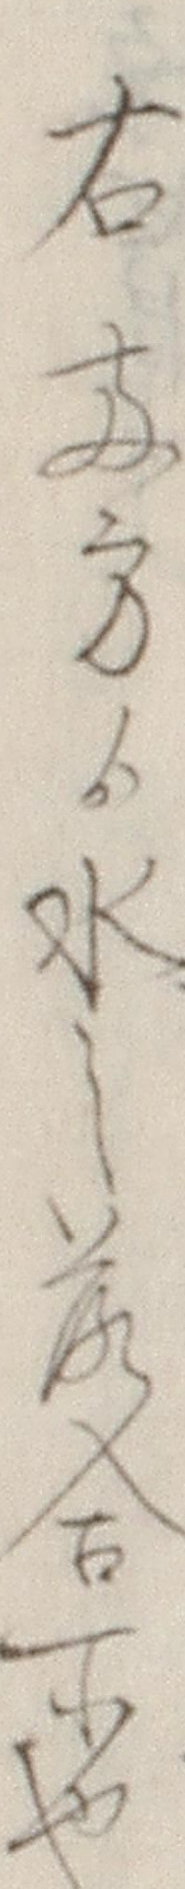右両方ゟ水之落合所也
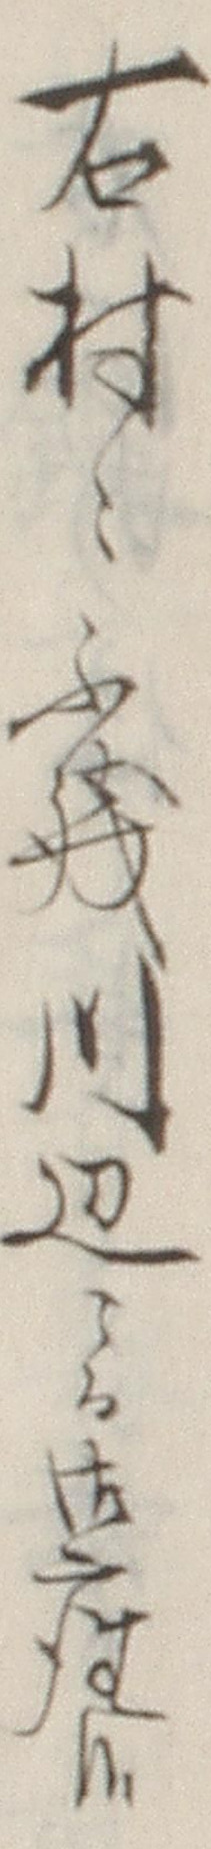右村々不残川辺ニ而御座候
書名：[諸国災害記録]
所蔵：東京大学地震研究所図書室 Earthquake Research Institute Library, The University of Tokyo, JAPAN
